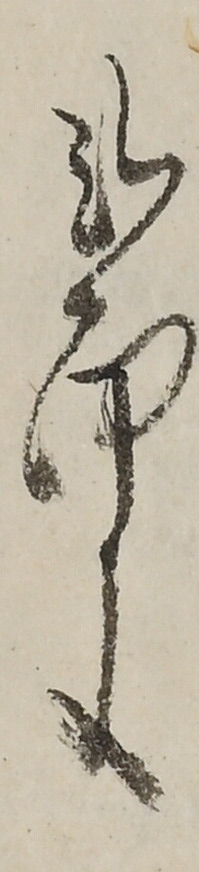弐百文
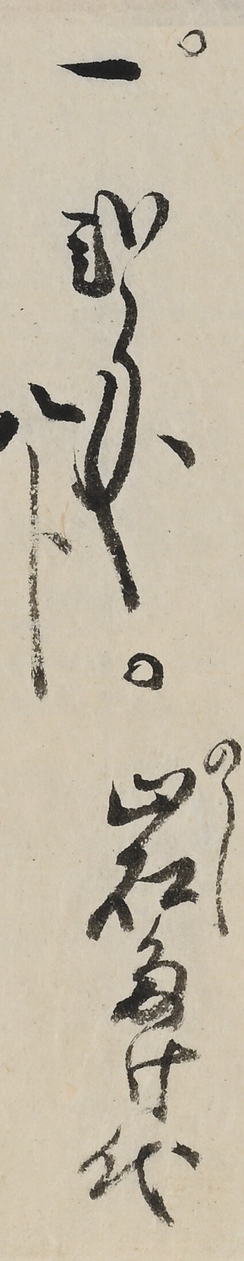一弐匁〇岩たけ代
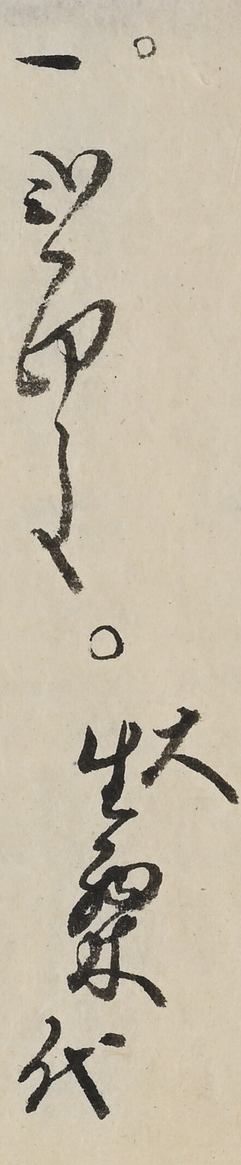一弐百文〇生栗代
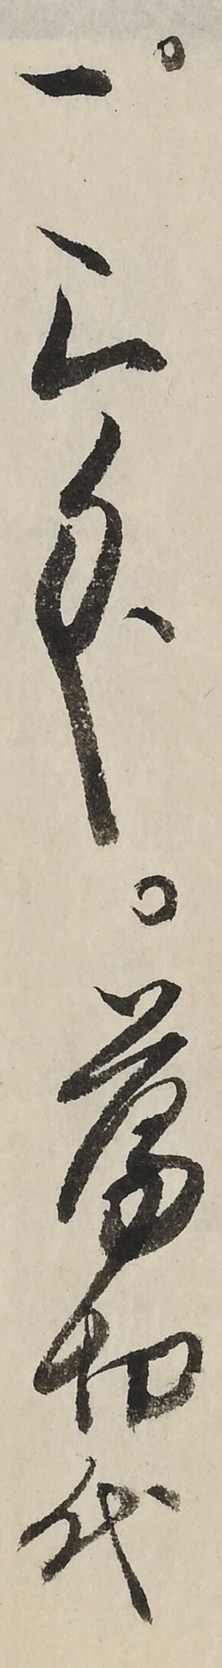一三匁〇葛切代
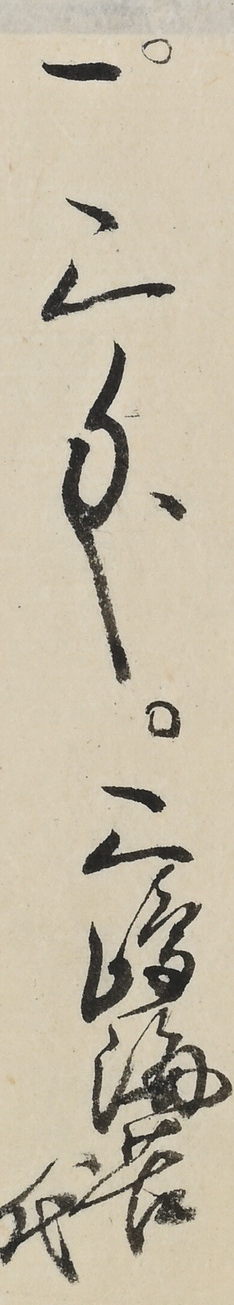一三匁〇三嶋海苔

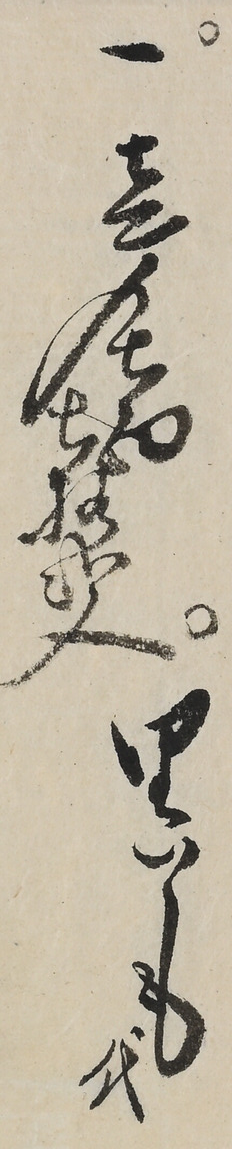一壱貫七百〇里いも代
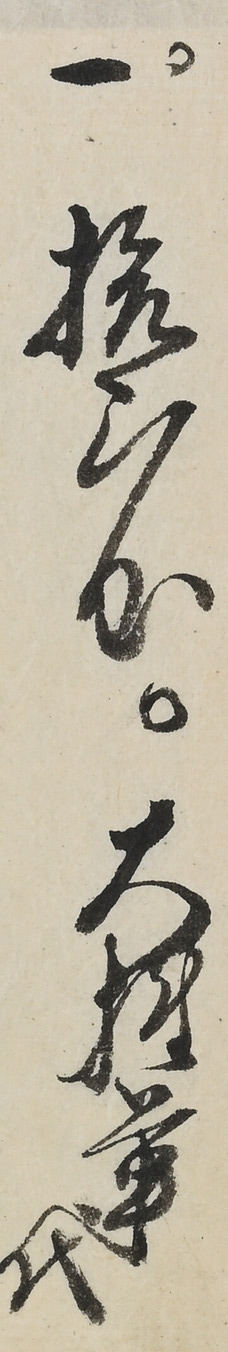一拾三匁〇大椎茸代

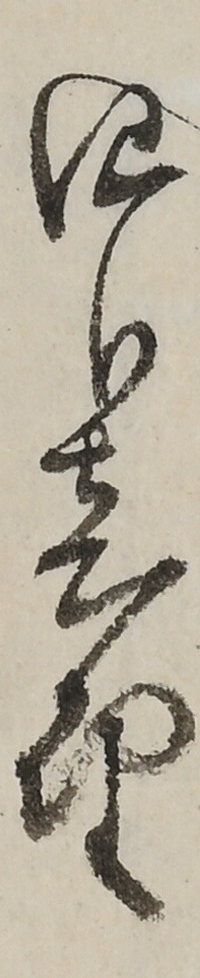四分壱厘
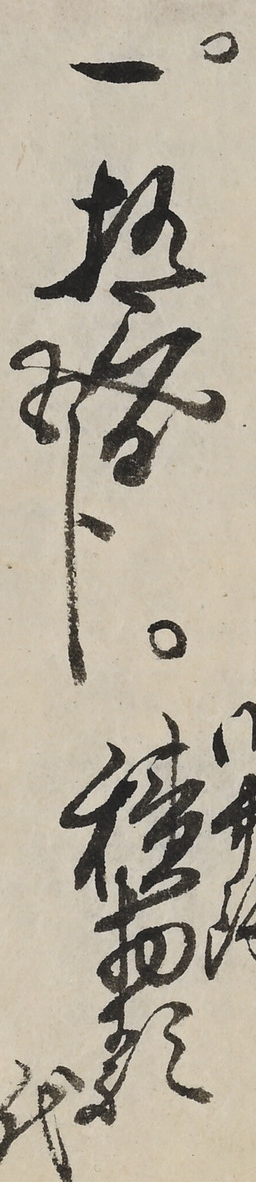一拾三匁〇積物預代

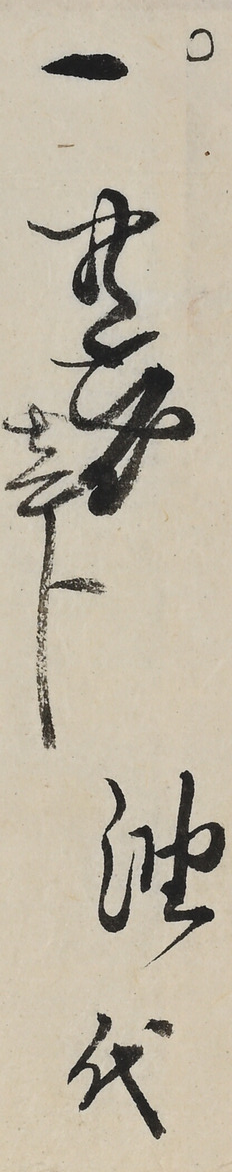一廿六匁〇油代
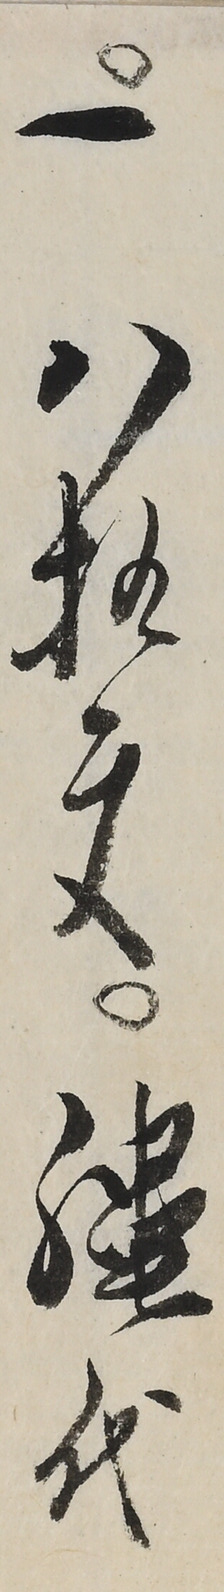一八拾文〇縄代
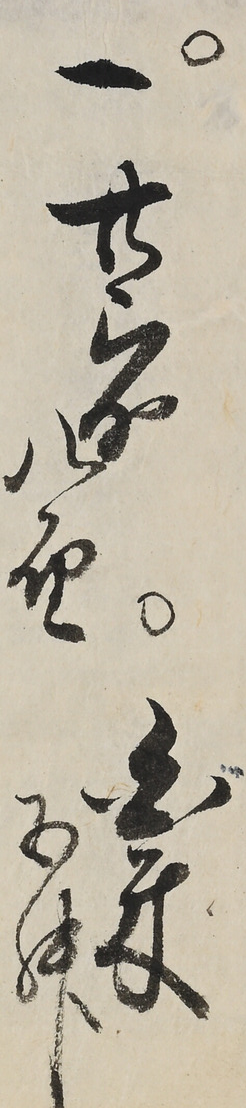一廿三匁〇白米
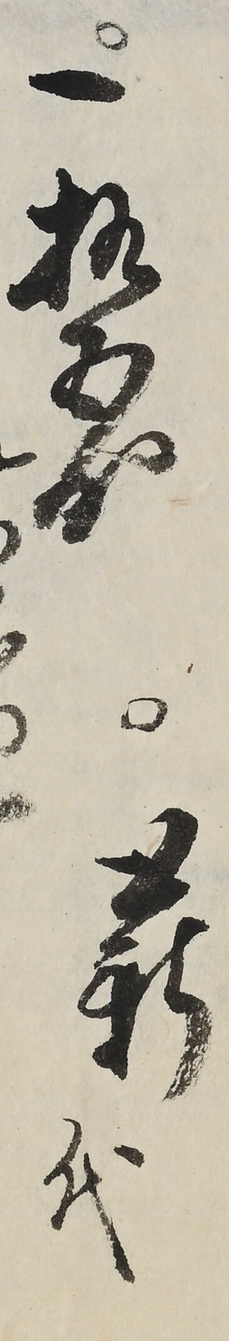一拾五匁〇薪代
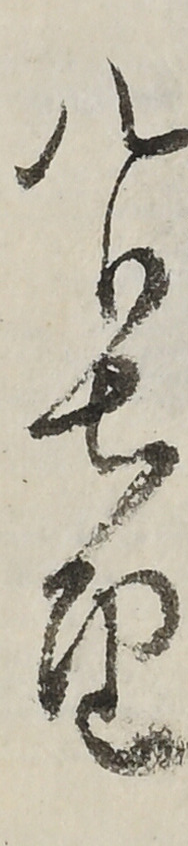八分七厘
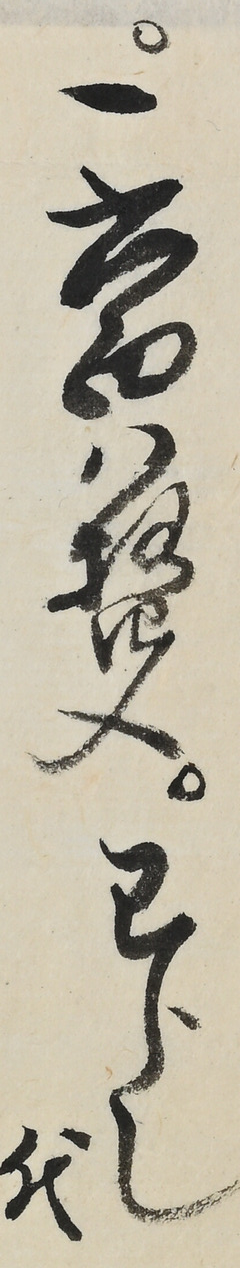一六百八拾四文〇わらし代

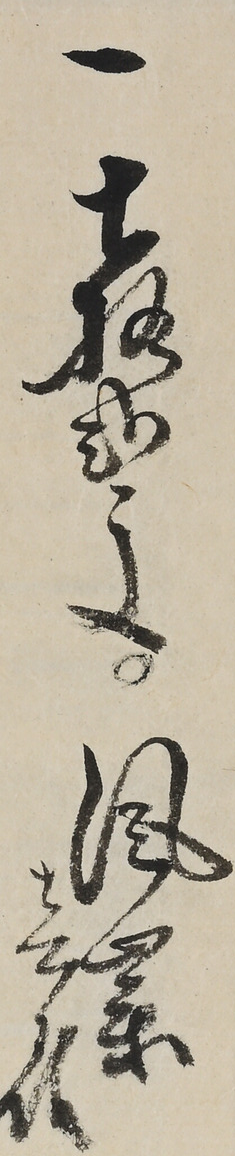一七拾弐文〇風薬
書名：御巡察様御泊御入用書上帳
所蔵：伊那市立高遠町図書館・合同会社AMANE
